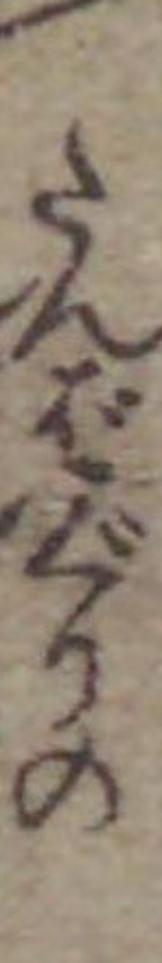たんばぐりの
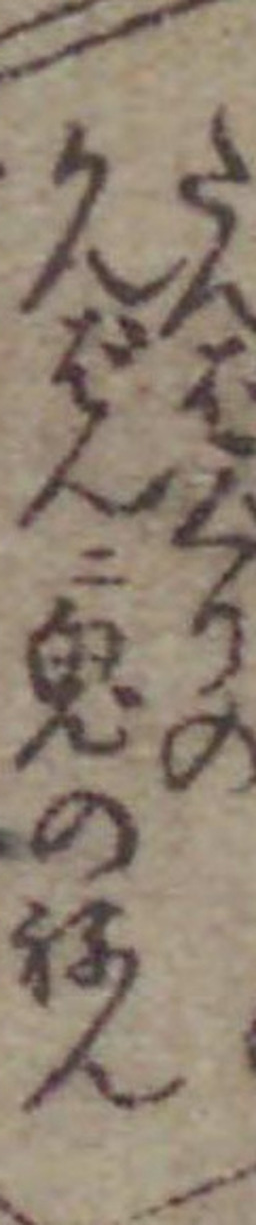かんばんに鬼のねん
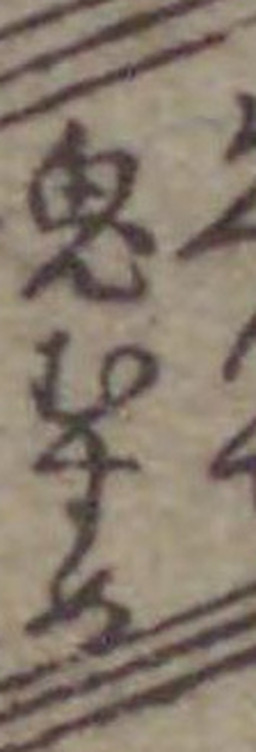鬼むすめ
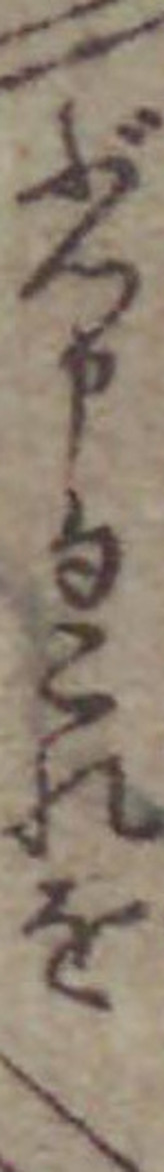ぶつ申句？これを
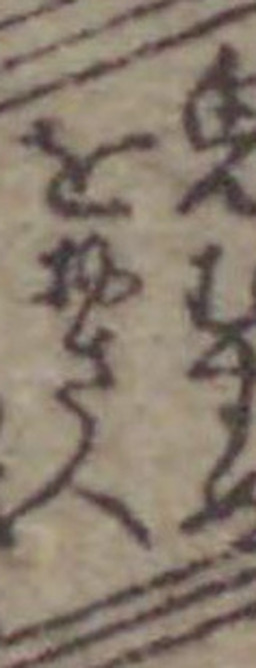をおさへ
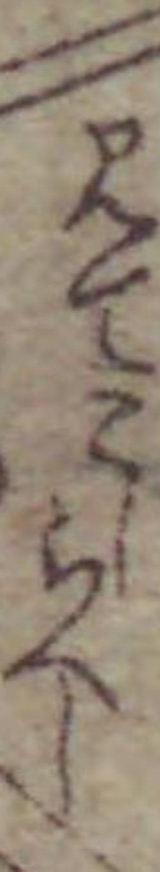見てこしらへし

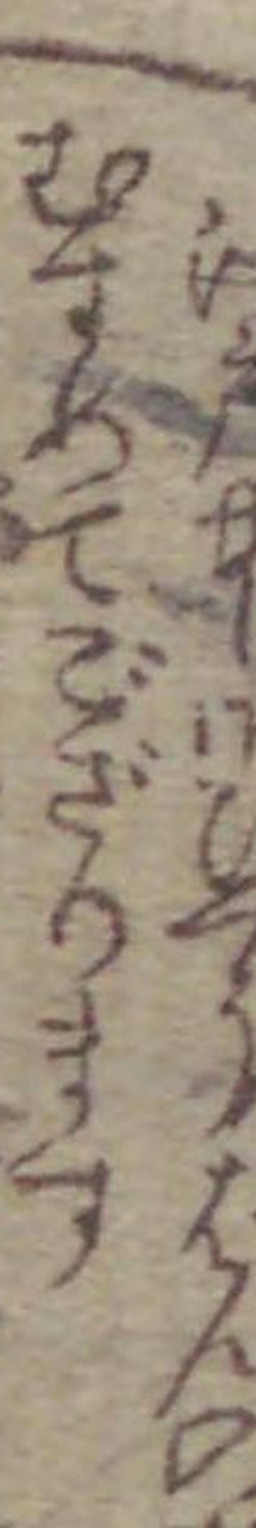むすめてござります
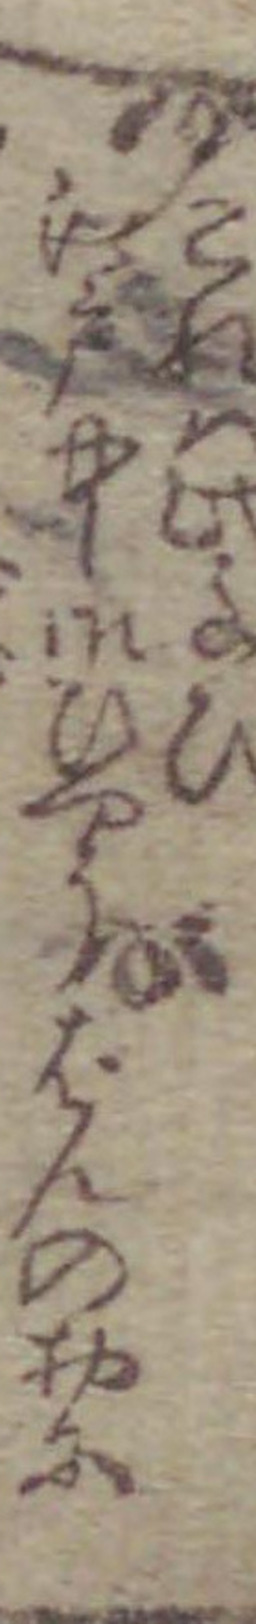江戸中御ひやうばんのおに
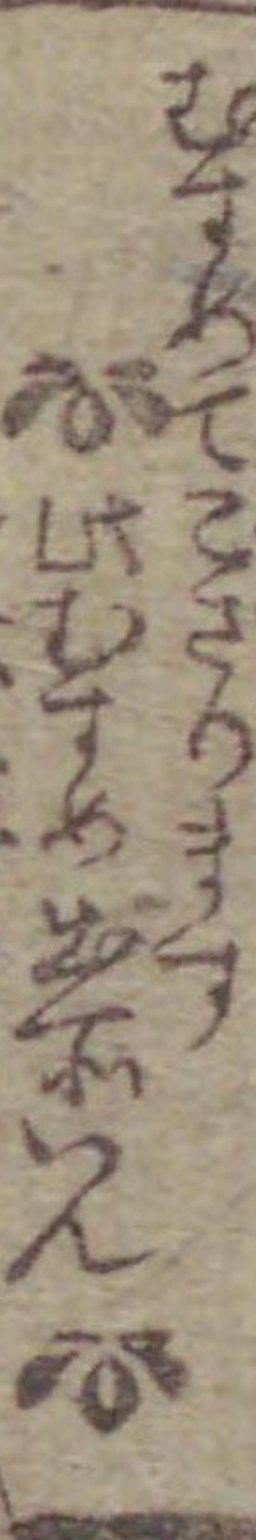此むすめ出所いん
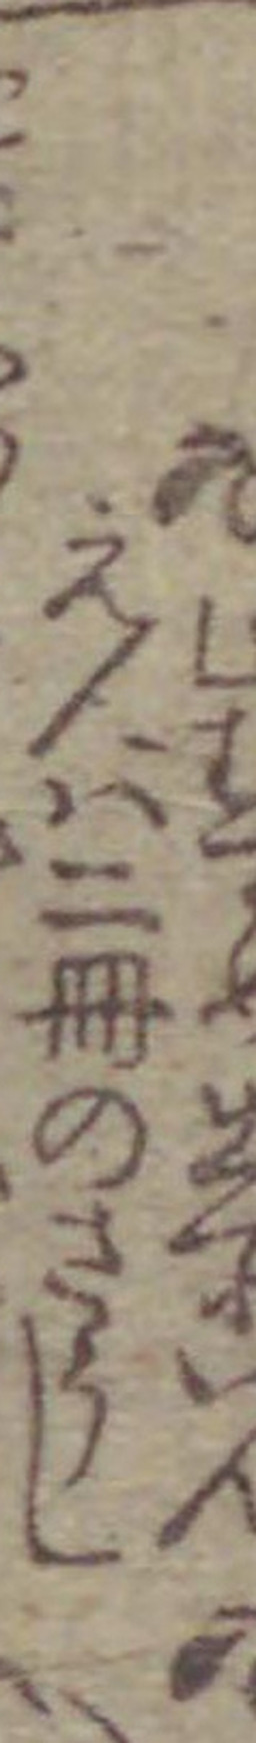えんは二冊のさうし
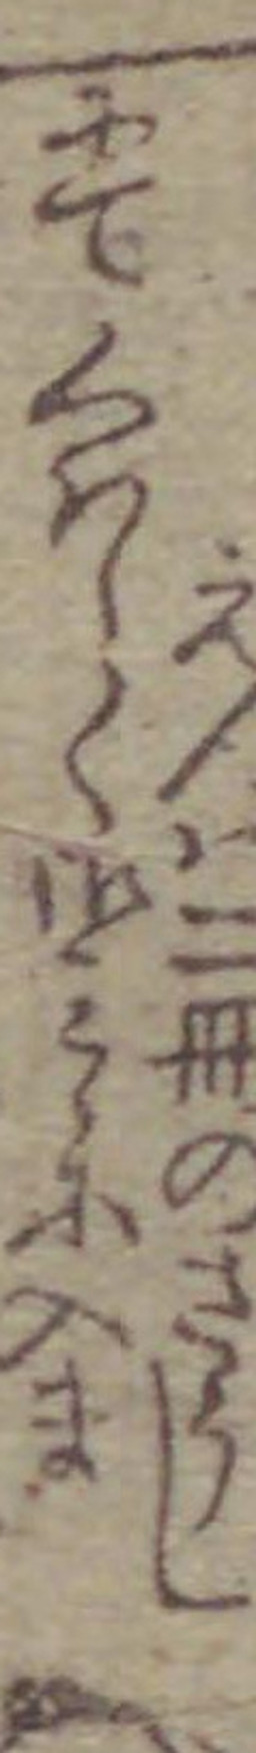にてくはしく御みゝに入ま
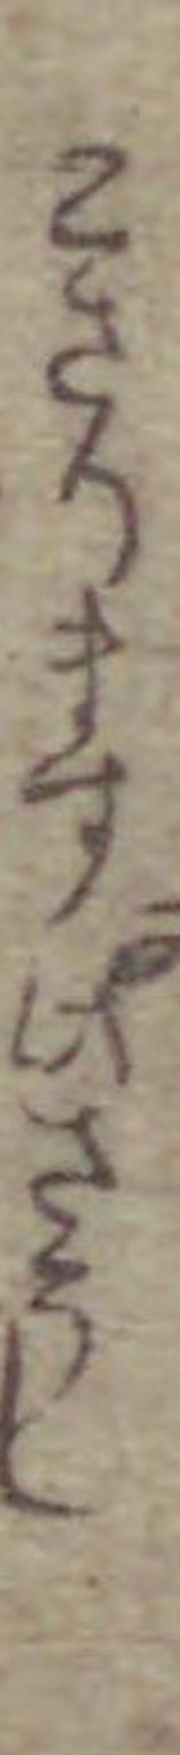こさります此さうし
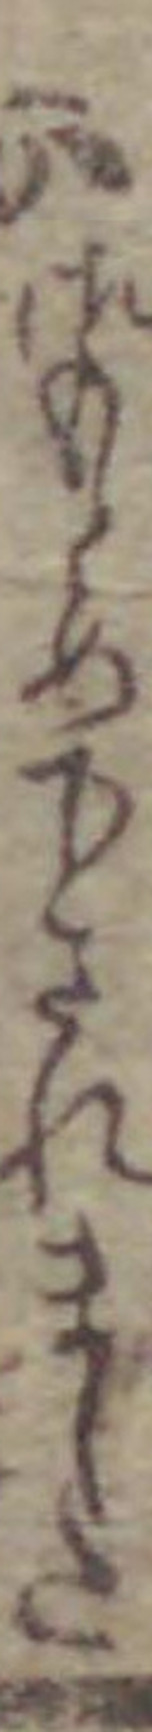御もとめ下されました
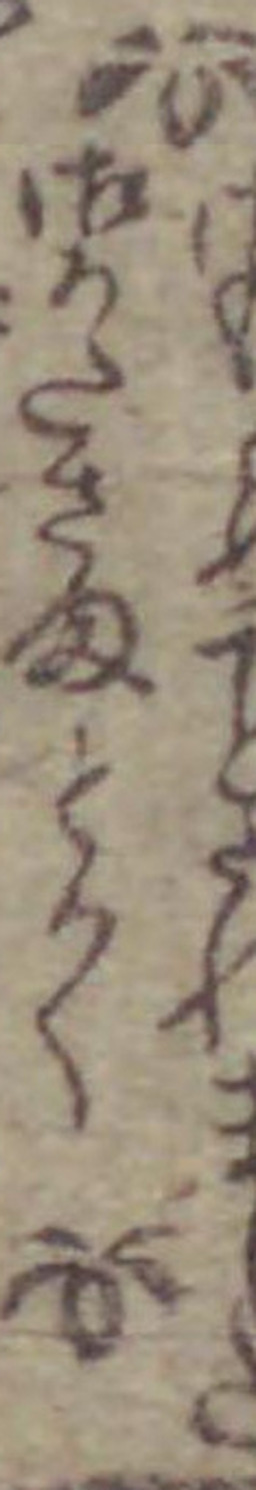御かたさまとかく
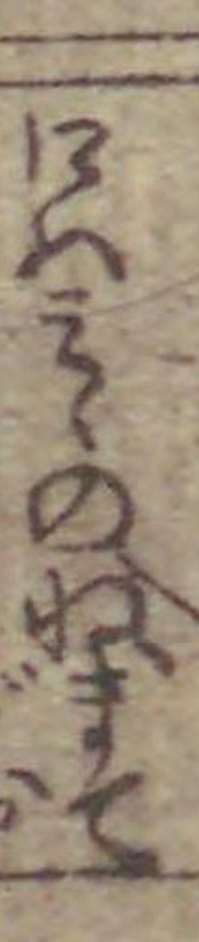口はみゝのねまて
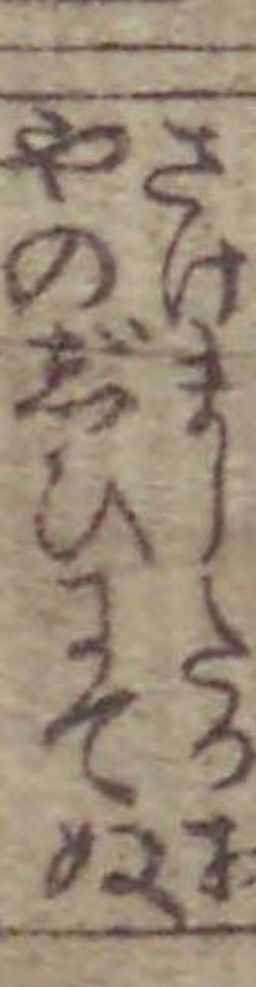やのじひにてぬ
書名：鬼の趣向草 2巻
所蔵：国立国会図書館 National Diet Library, JAPAN
